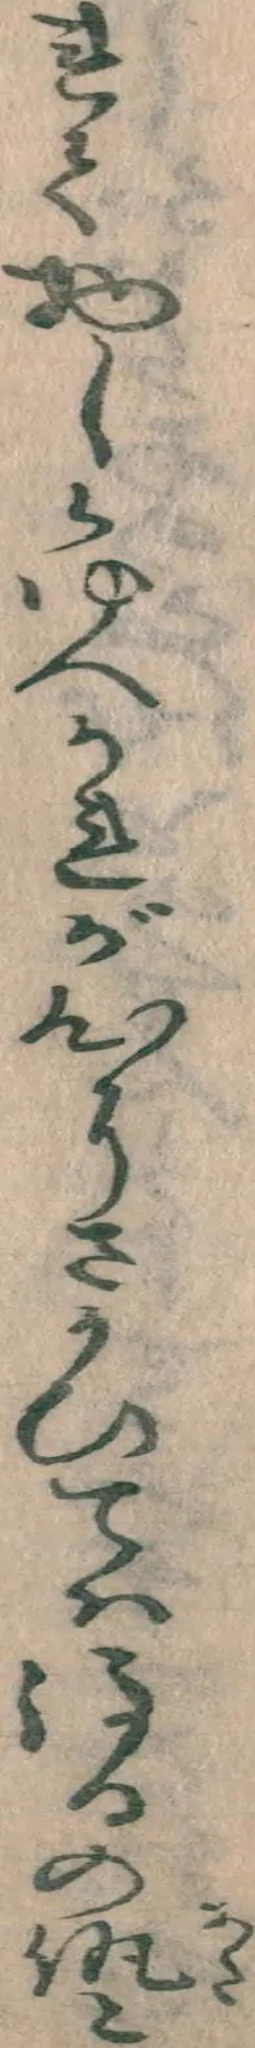れて物しらゆへかれが心にさかひては後日の仇と
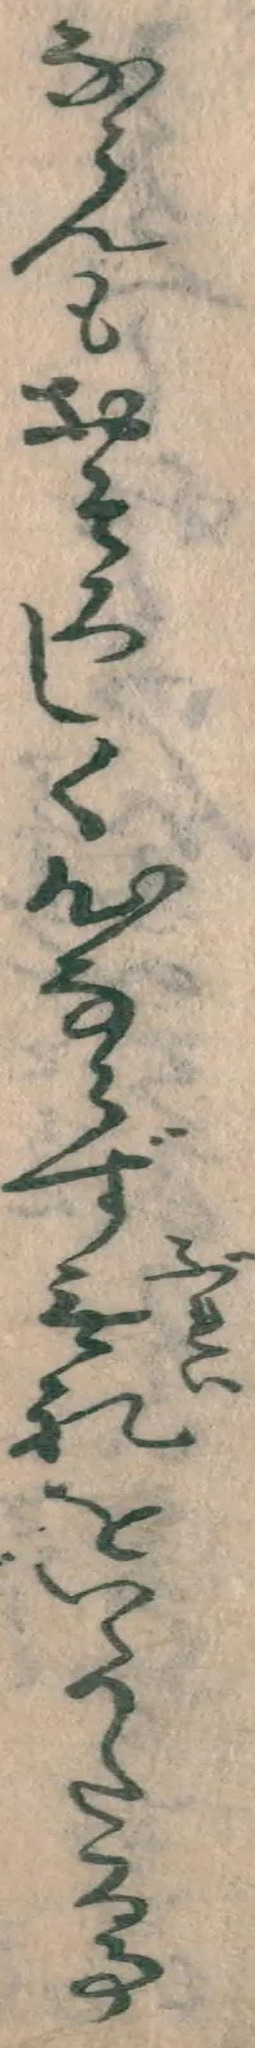ならんもおそろしく心ならず無礼いゝかたる事
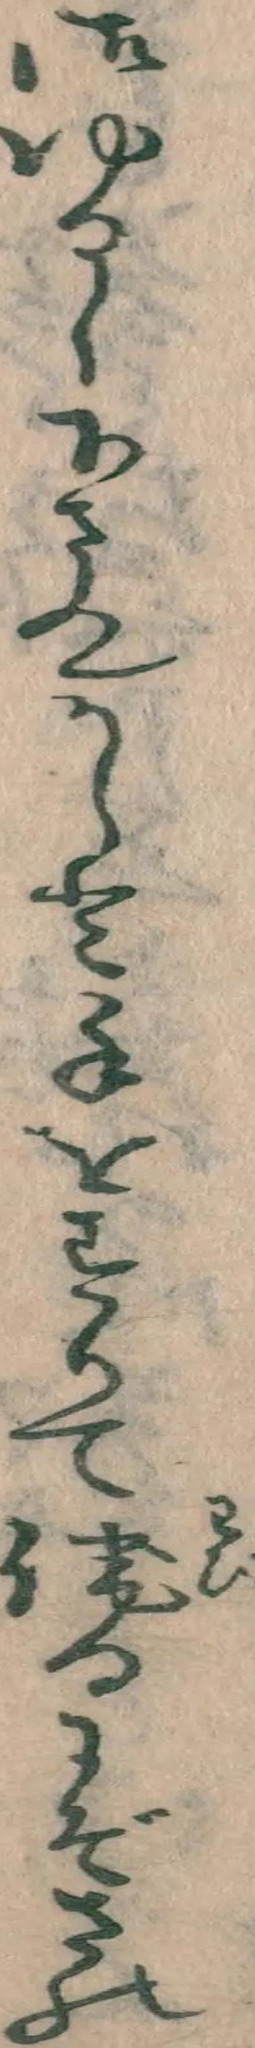御ゆるし下されかしと手をすりて侘るにぞさの
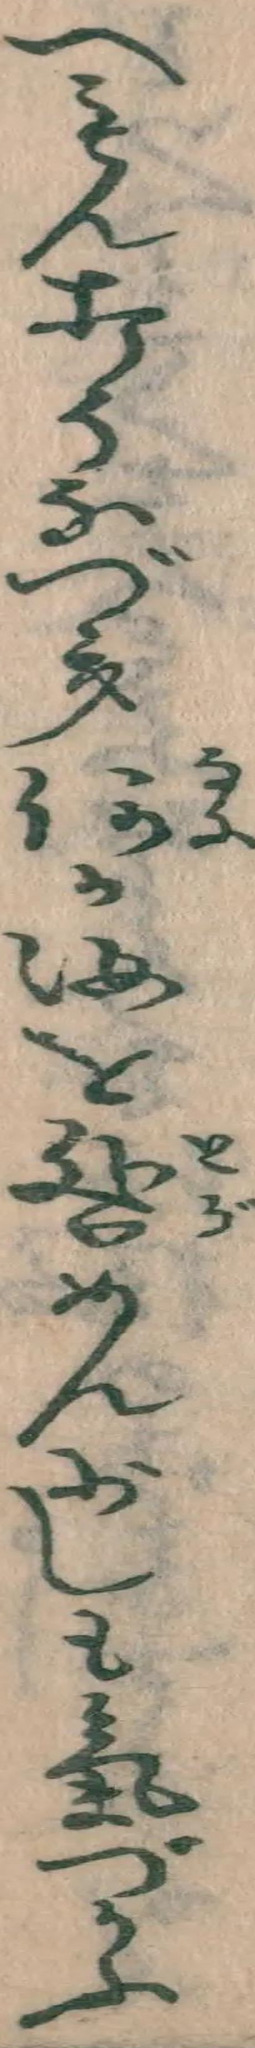へもん打うなづき何か汝を咎めん少しも氣づかふ
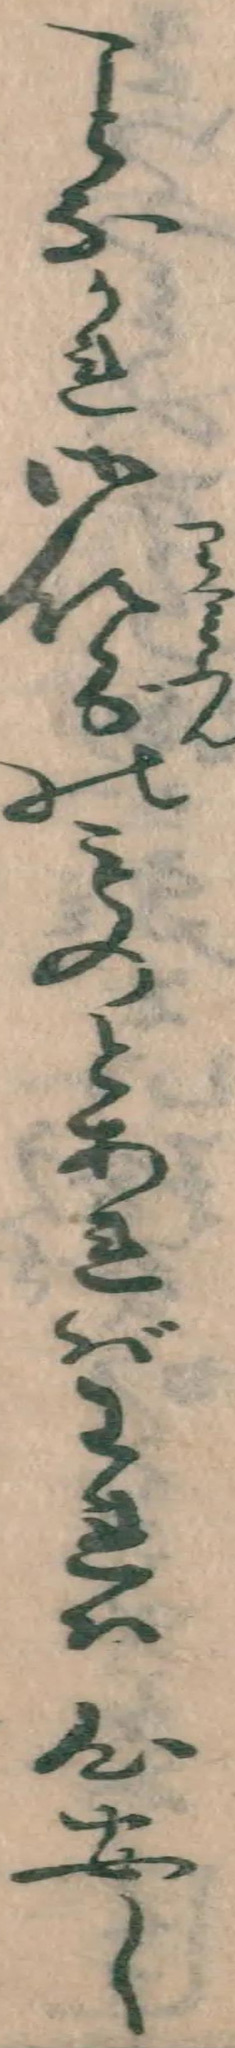ことなかれ御領分のものとあればわれは心安し
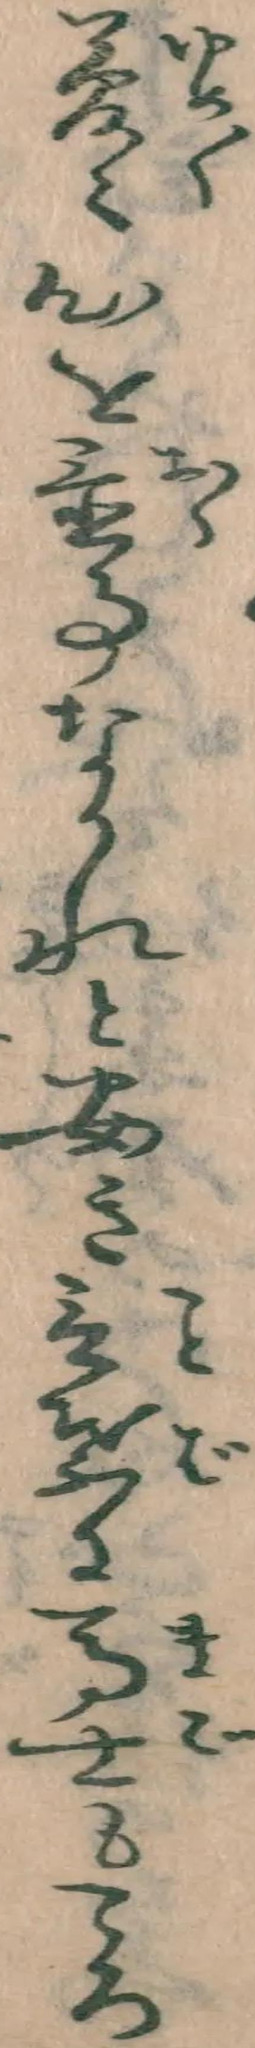夢々心を置事なかれと安き言葉に馬子もこゝろ
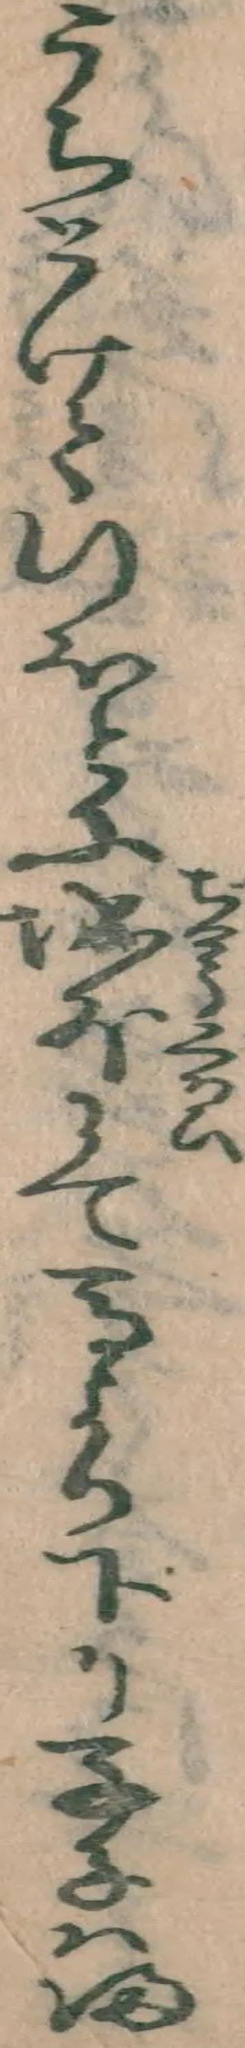うちとけて行ほとに城外にて馬より下り馬子は帰
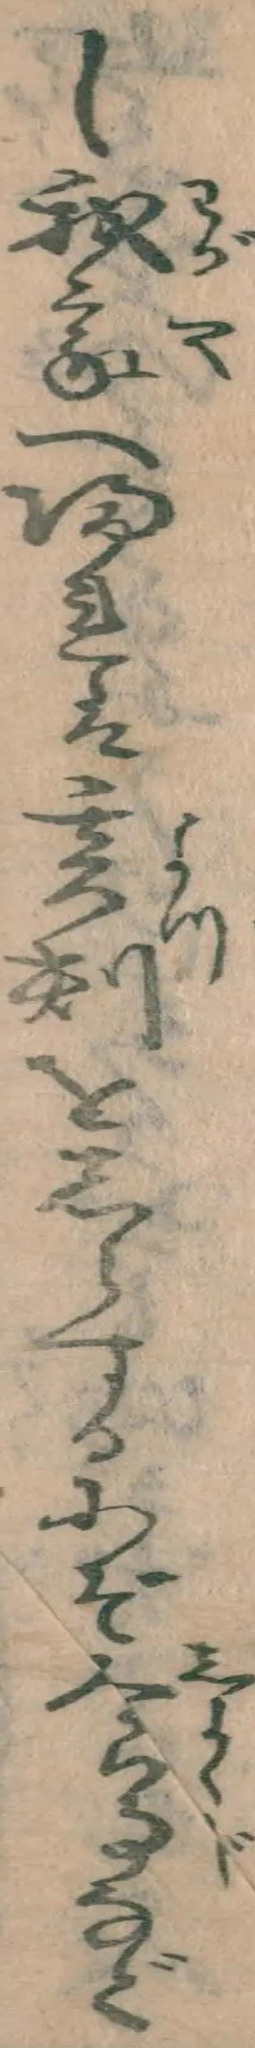し我家へ帰れは亥刻をしらするにぞ食事など
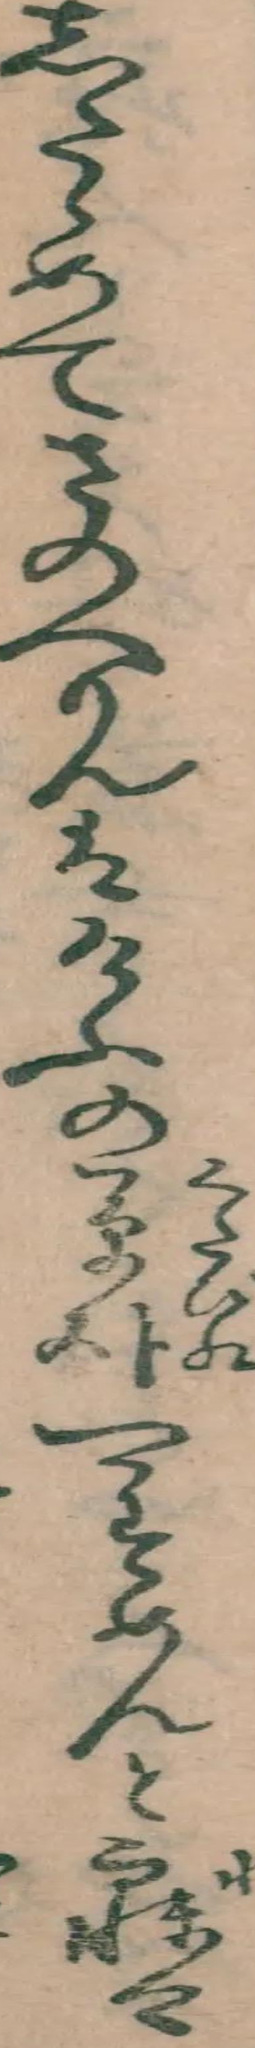したゝえてさのへもんはけふの草臥やすめんと寝や
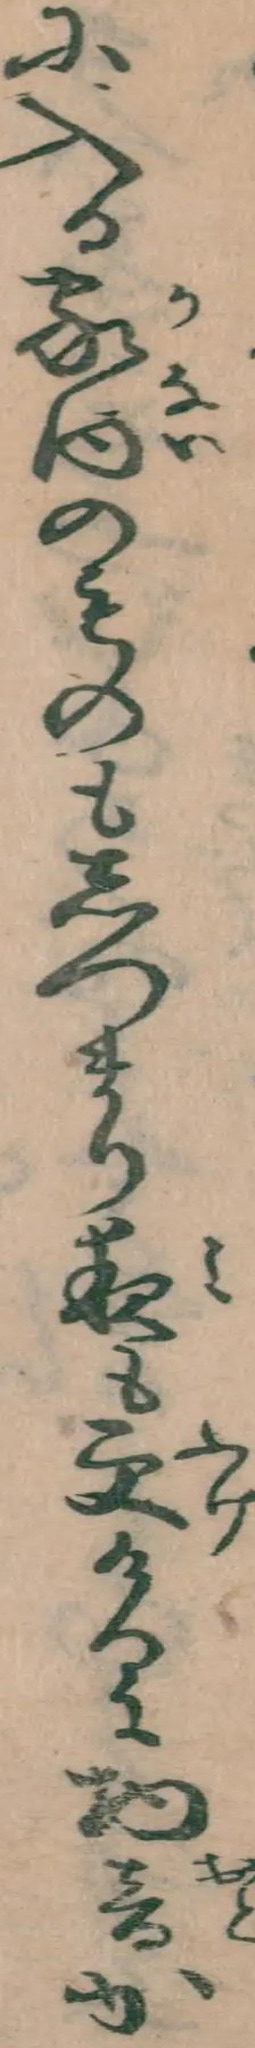に入る家内のものもしつまり夜も更けるに物音か
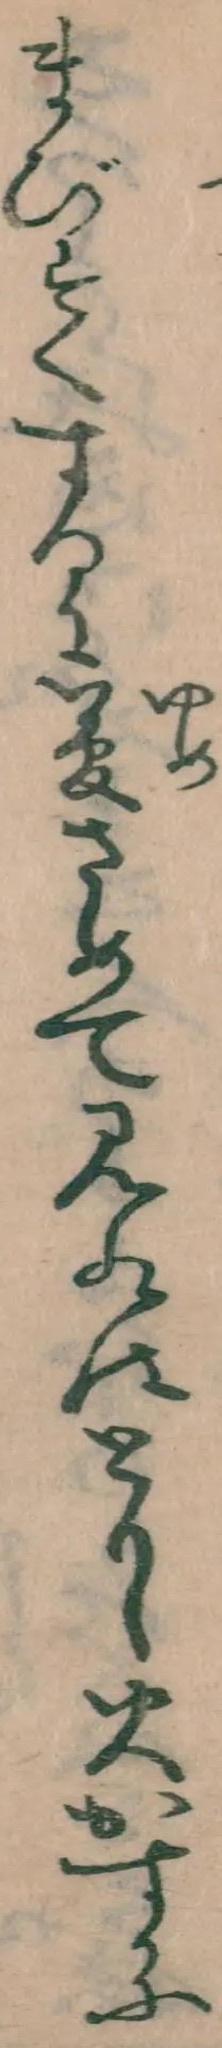まびすくするに夢さめて見れはともし火かすかに
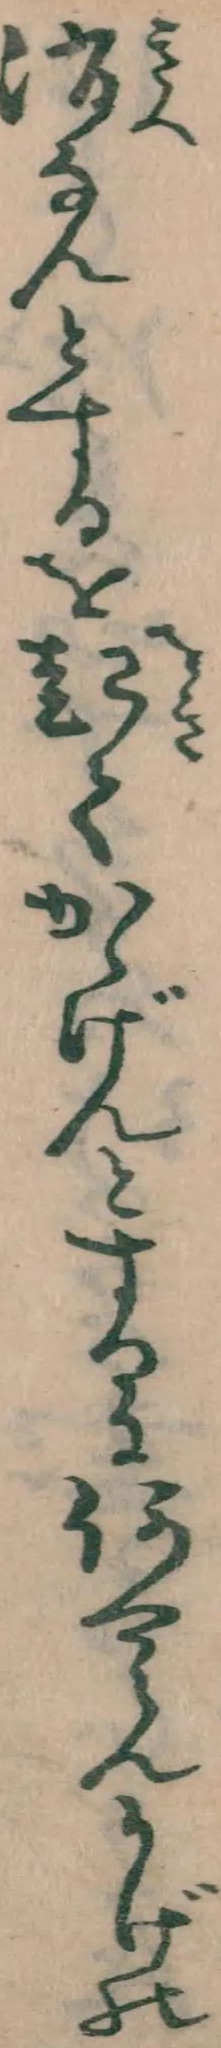消なんとするを起てかゝげんとするに何やらんかげの
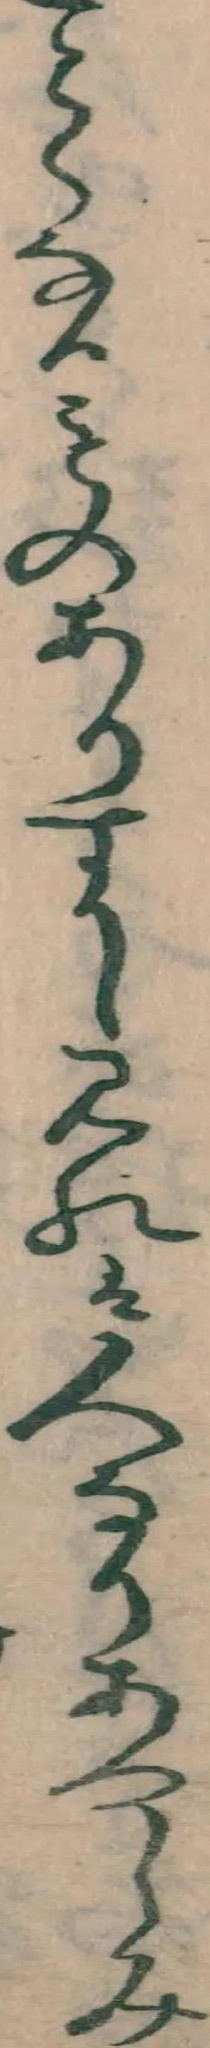ことくならんものありすかし見れは人なりあやしみ
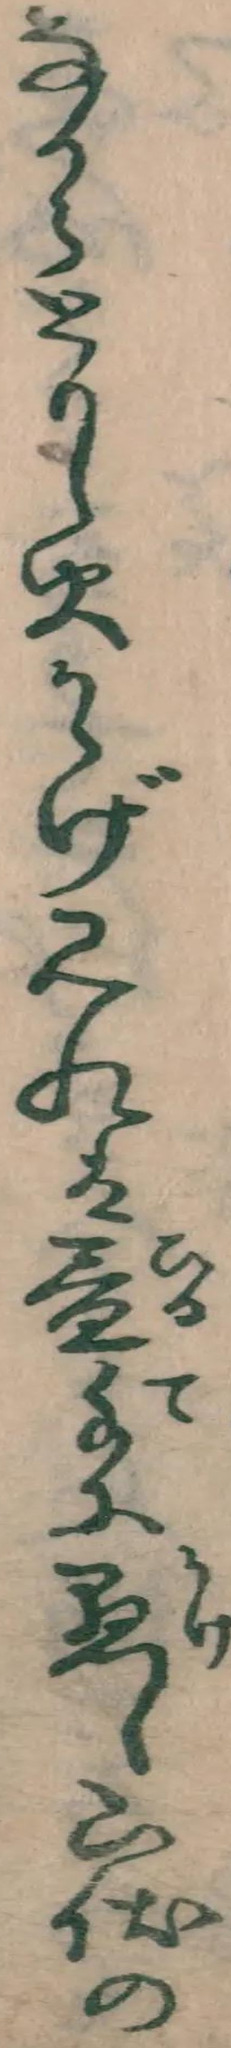なからともし火かゝげ見れは昼手に懸し山伏の
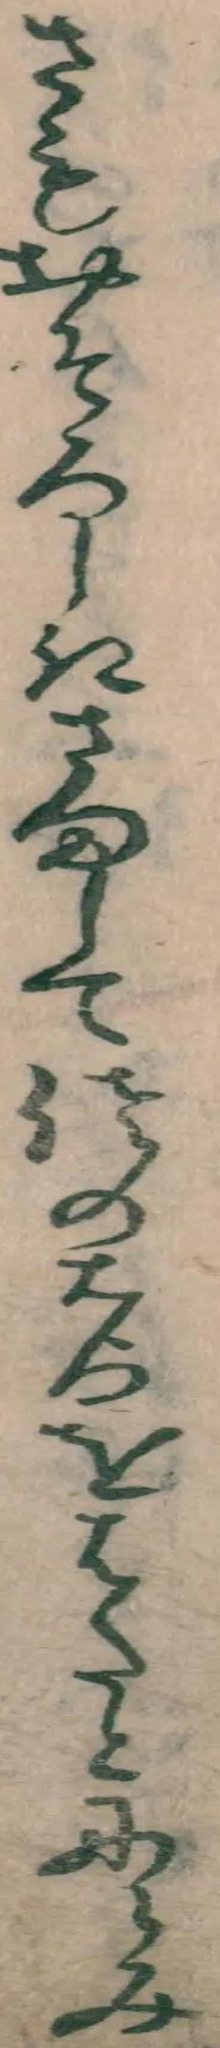さもおそろしきさましてさの右衛門をはたとにらみ
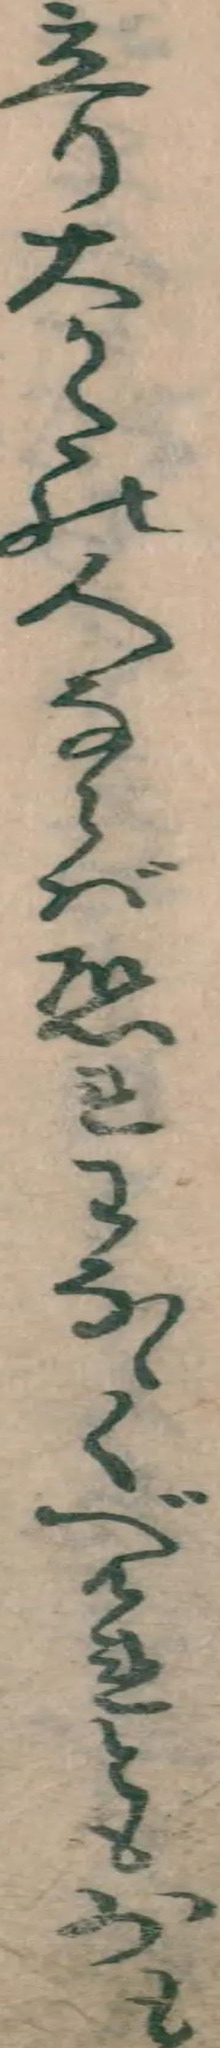立り大かたの人ならば恐れわなゝくべけれとも少も
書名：怪談御伽童 5巻. [2]
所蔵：国立国会図書館 National Diet Library, JAPAN
